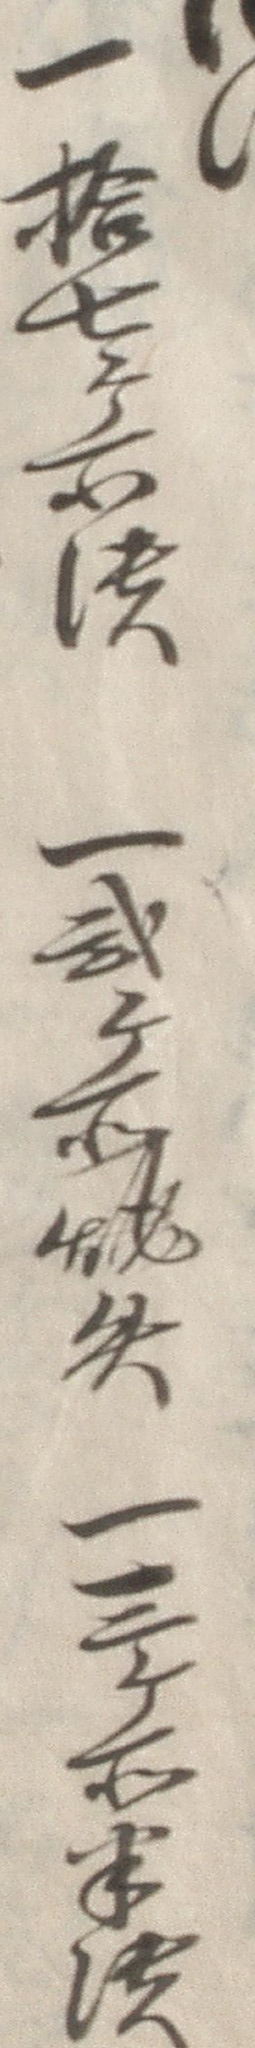一拾七ヶ所潰一二ヶ所焼失一三ヶ所半潰
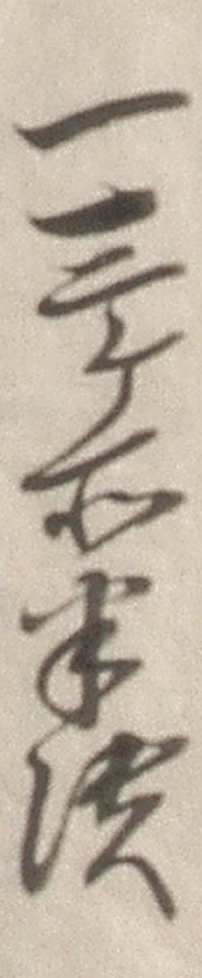一厩一ヶ所半潰
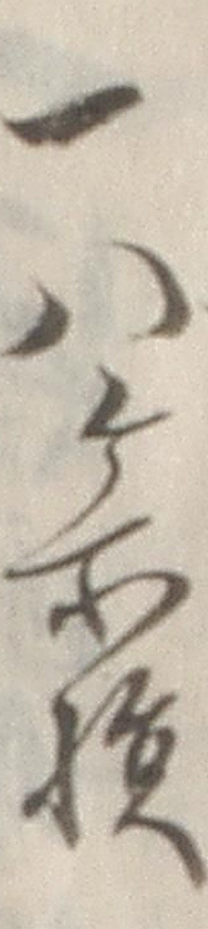一八ヶ所損
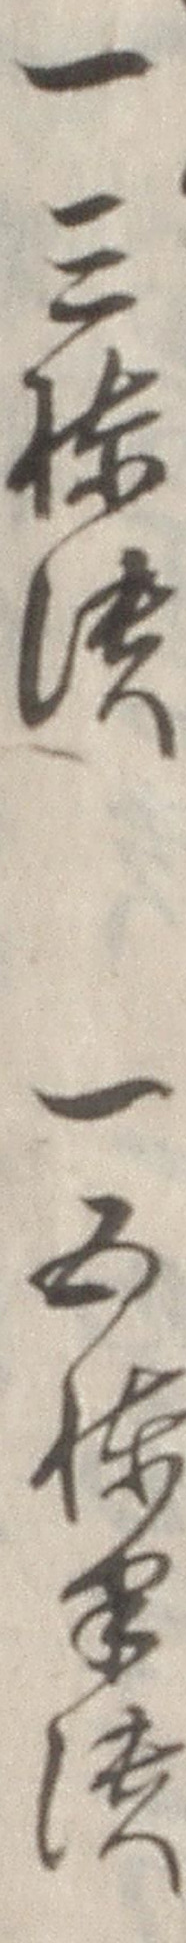一三棟潰一五棟半潰
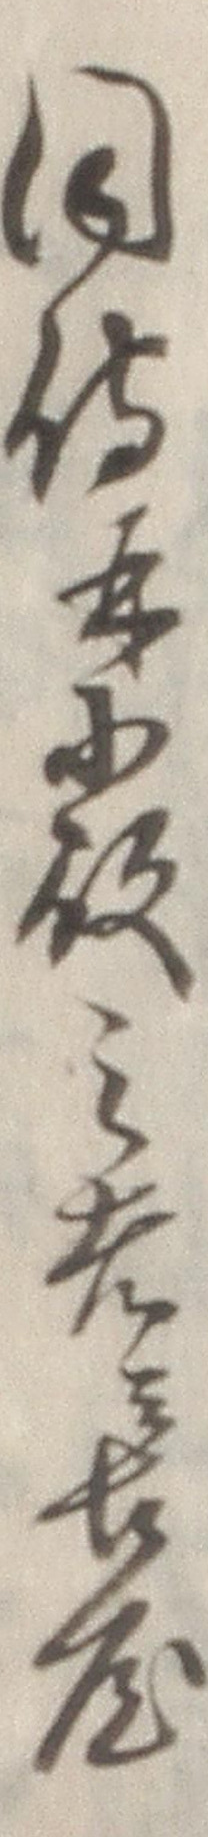同侍并小役之者之長屋
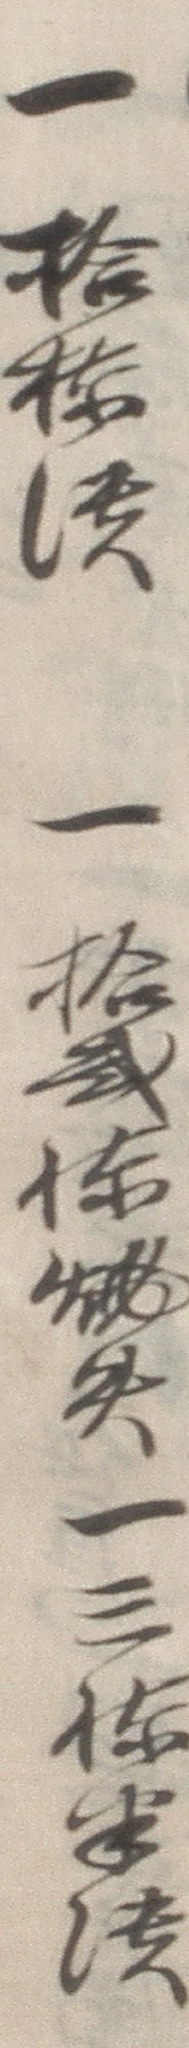一拾棟潰一拾弐棟焼失一三棟半
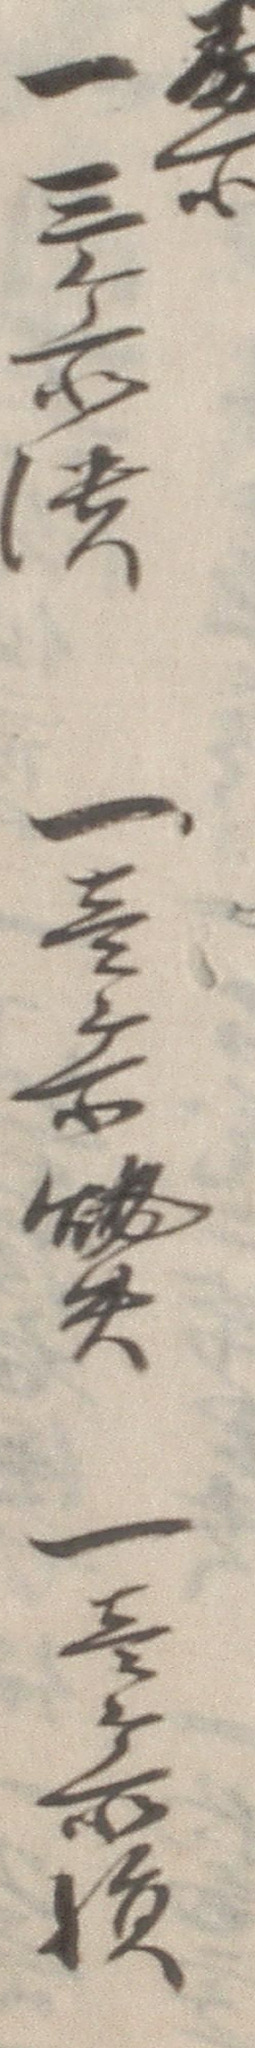一三ヶ所潰一壱ヶ所焼失一壱ヶ所損
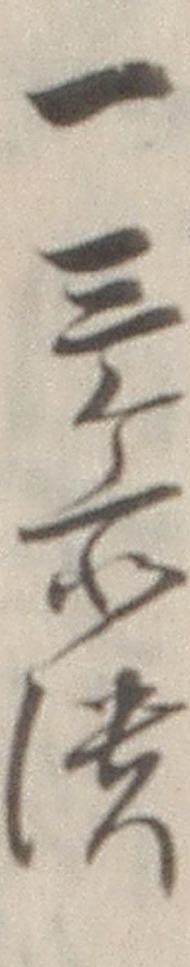一八ヶ所損
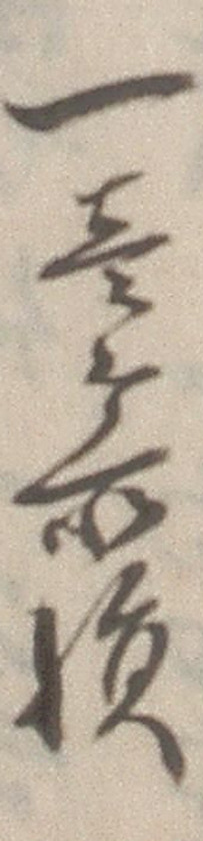一八ヶ所損
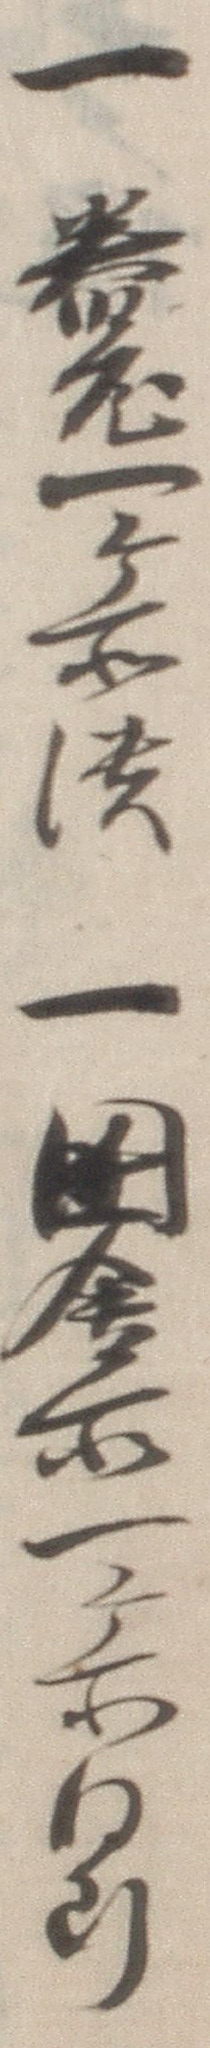一舂蔵一ヶ所潰一囲舎所一ヶ所同断
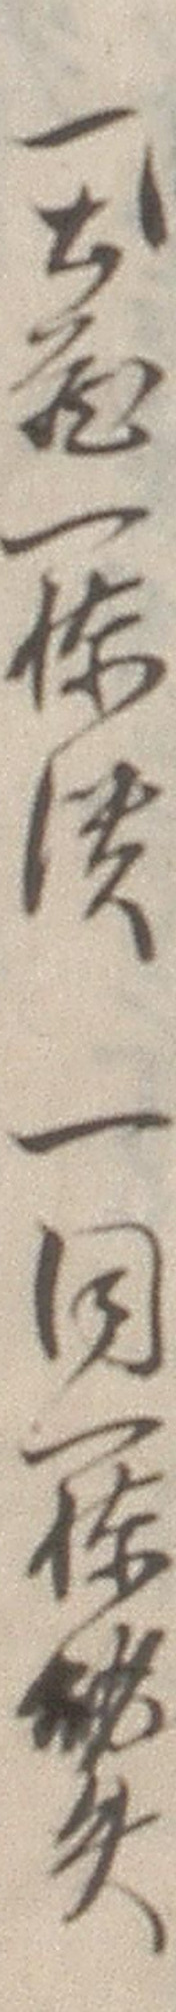一土蔵一棟潰一同一棟焼失
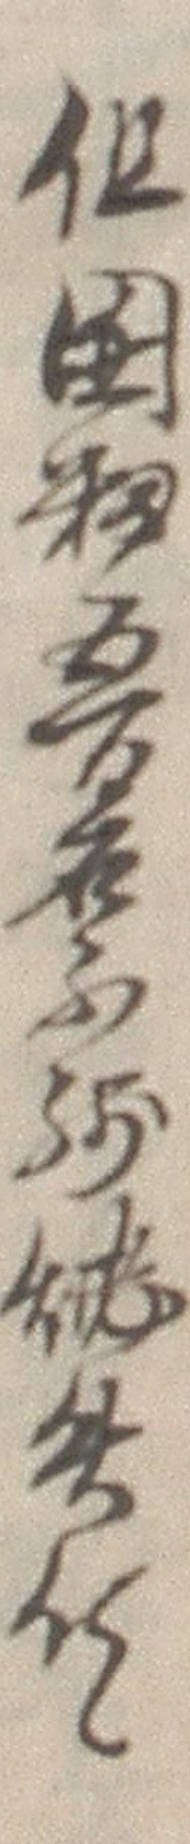囲籾五百石不残焼失仕候
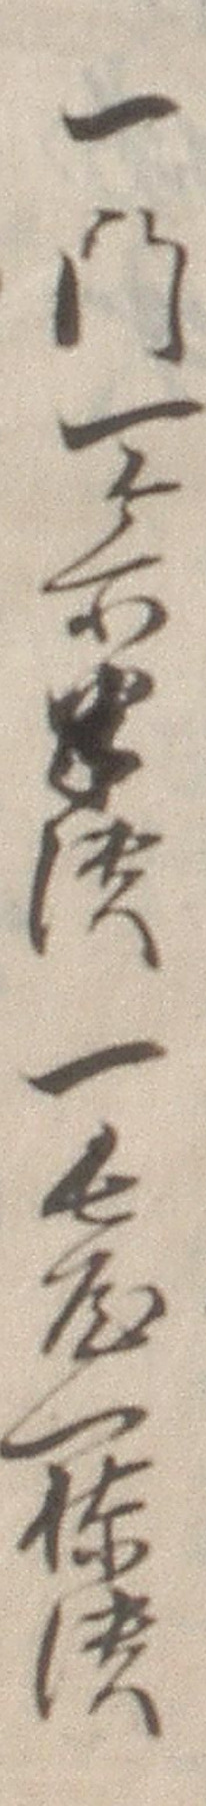一門一ヶ所半潰一長屋一棟潰
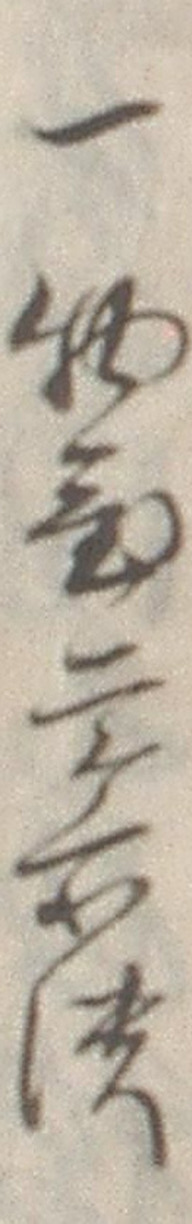一物置二ヶ所潰
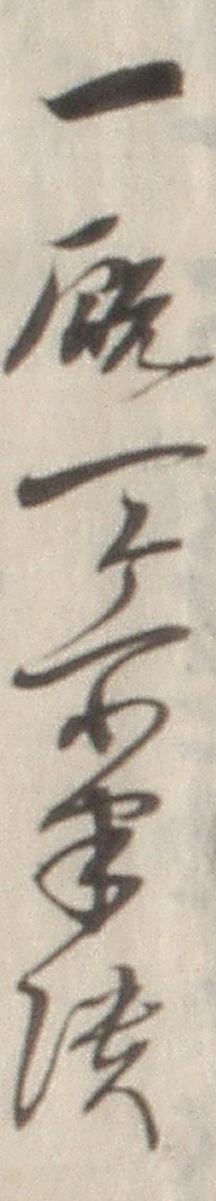一厩一ヶ所半潰
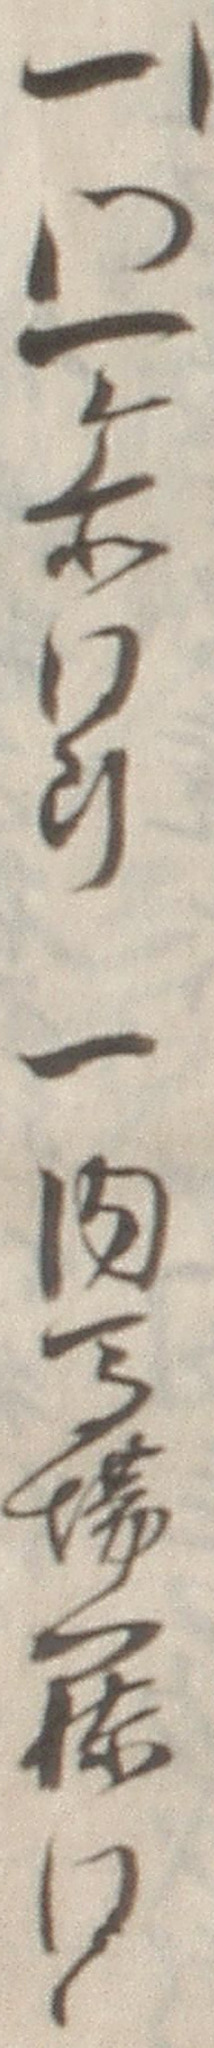一門一ヶ所同断一内馬場一棟同
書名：信州地震一件
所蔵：東京大学地震研究所図書室 Earthquake Research Institute Library, The University of Tokyo, JAPAN
